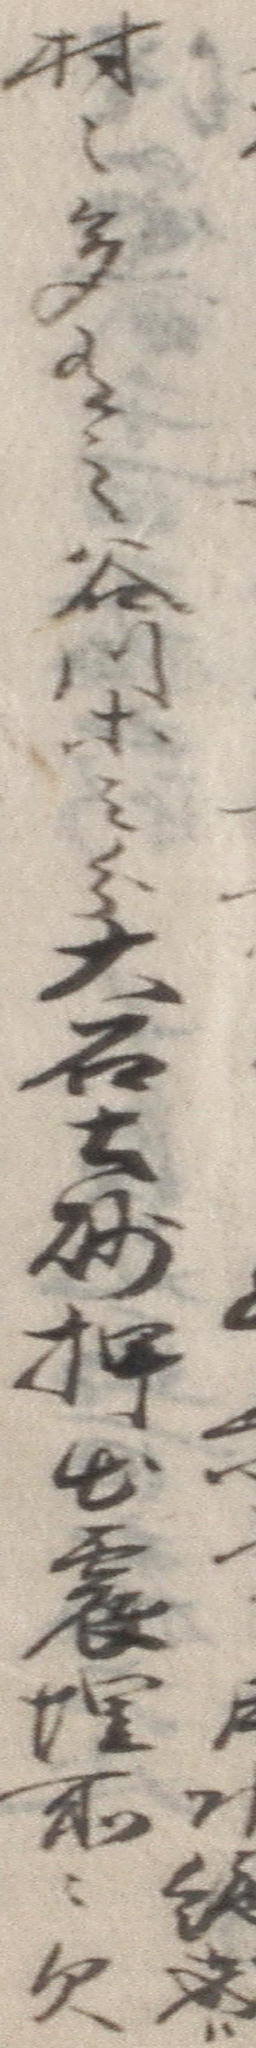村々多有之谷川等之分大石土砂押出震埋所々欠
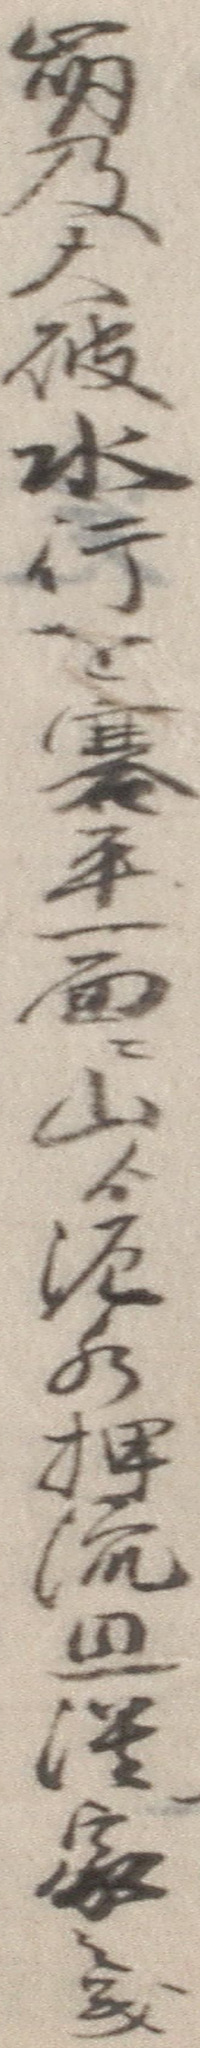崩及大破水行を塞平一面ニ山ゟ泥水押流且潰家之義
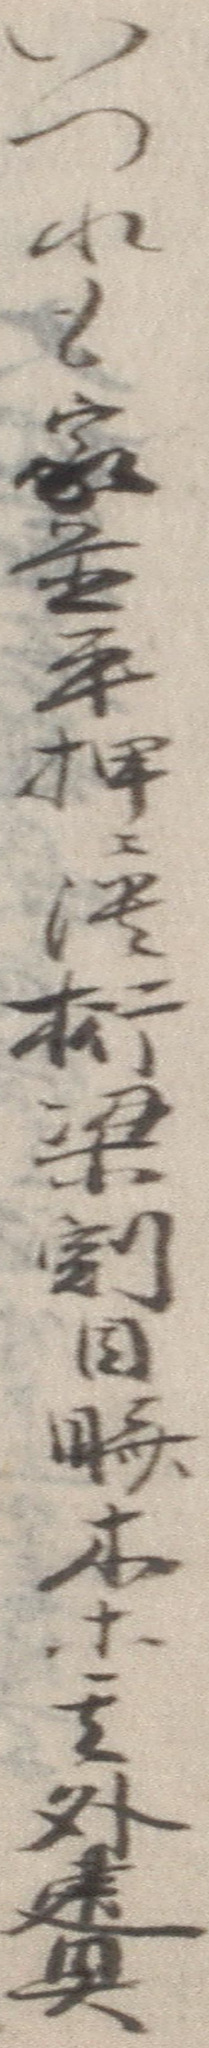いつれも家並平押ニ潰桁梁割目済木等其外建具
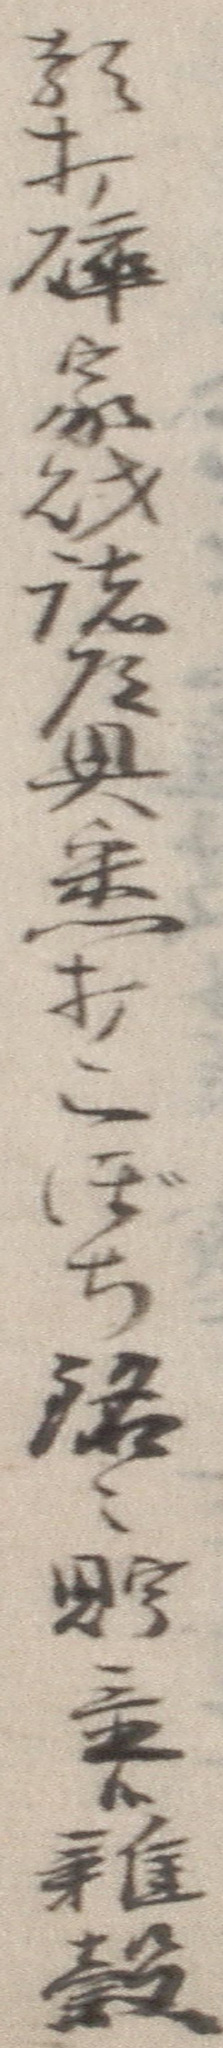類打砕家財諸道具悉打こぼち銘々貯置候雑穀
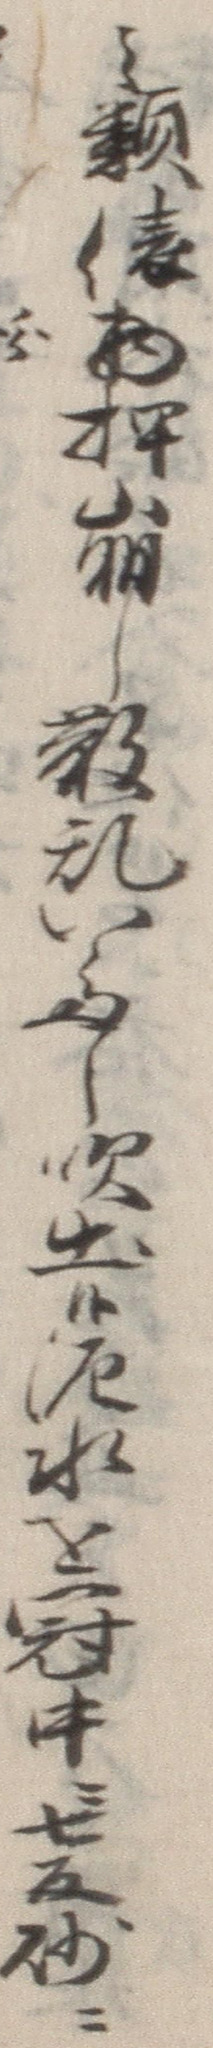之類俵物押崩し散乱いたし吹出候泥水を冠中ニ七反砂ニ
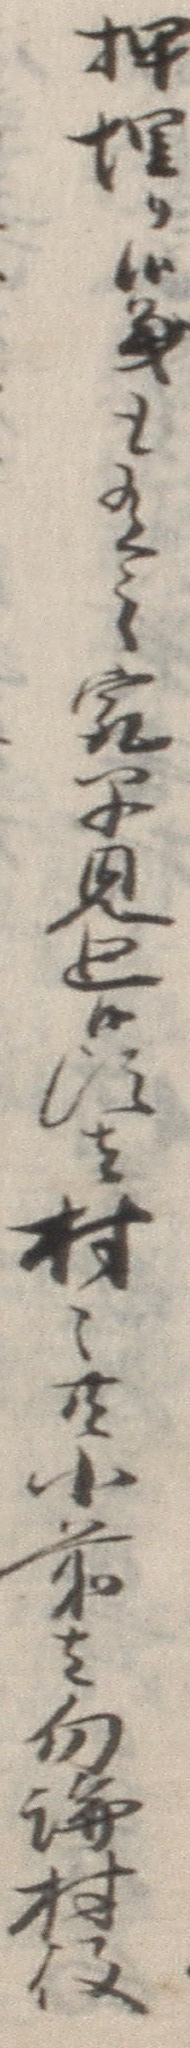押埋リ候分も有之最早見廻候頃は村々共小前は勿論村役
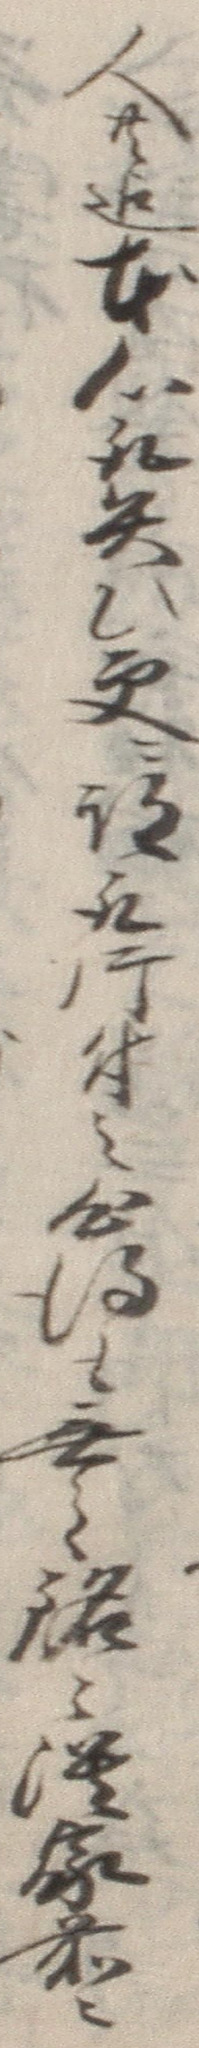人共迄本心取失ひ更ニ跡取片付之心得も無之銘々潰家前ニ
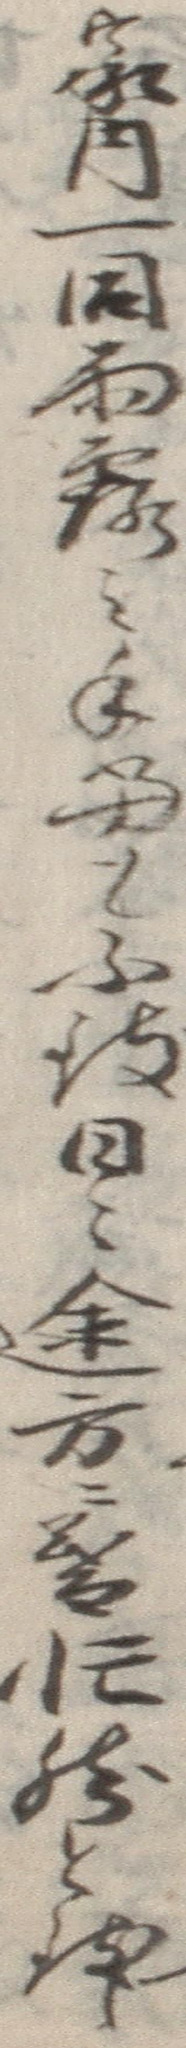家内一同雨露之手当も不致日々途方ニ暮忙然と致し
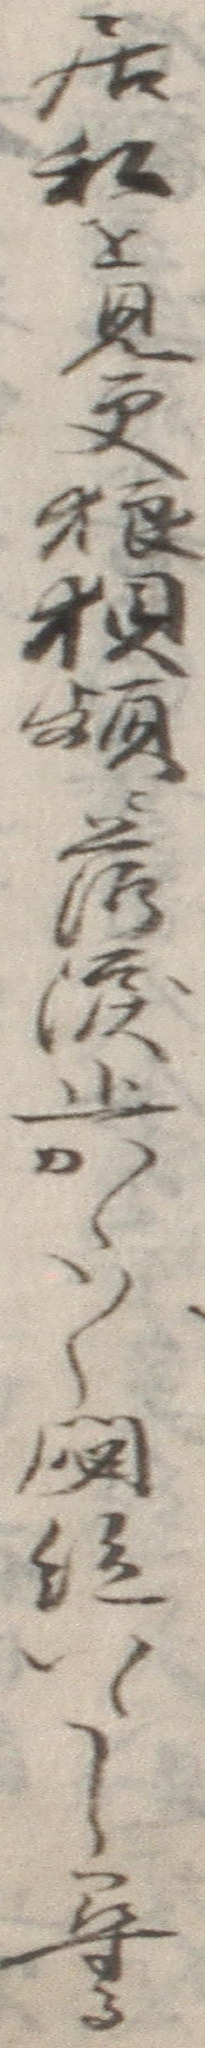居私を見更狼狽頻ニ落涙止かたく悶絶いたし尋る
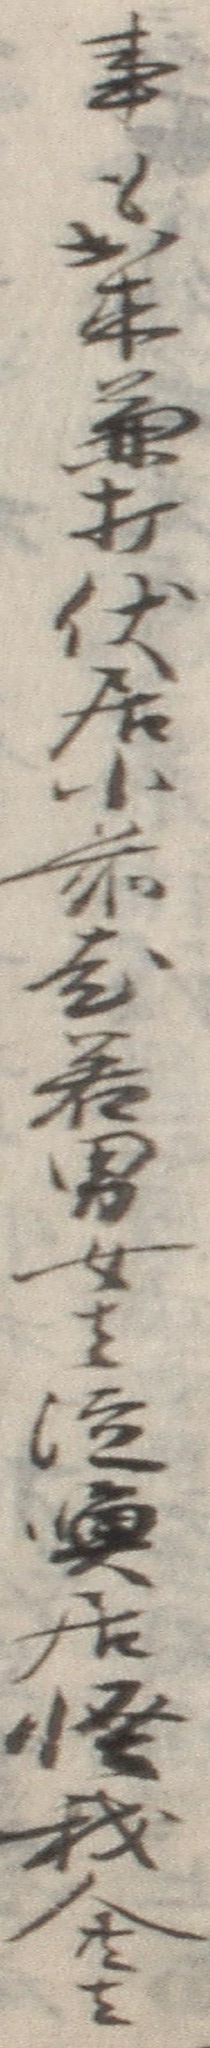事も出来兼打伏居小前老若男女は泣喚居怪我人共は
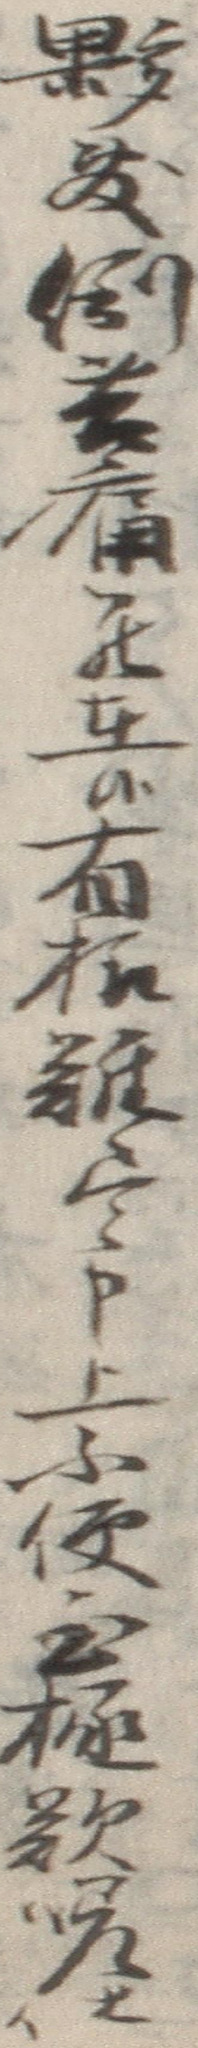夥敷倒苦痛罷在候有様難尽申上不便至極歎嗟仕
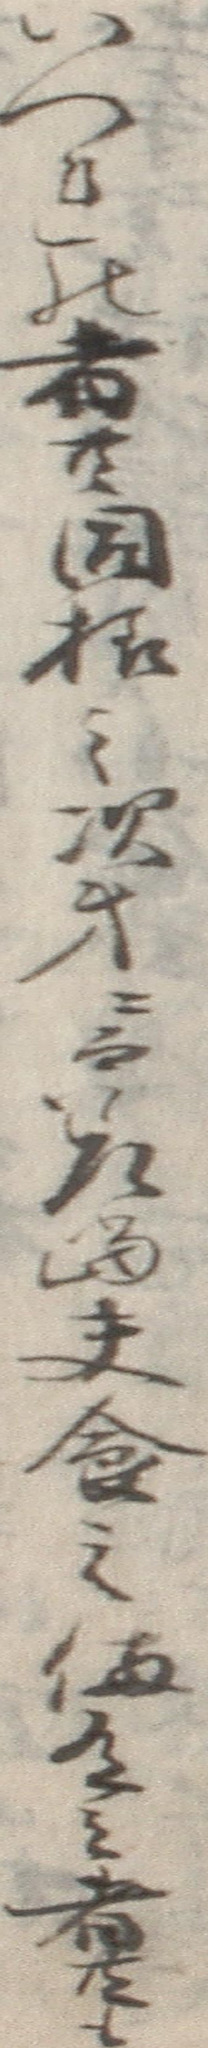いつれの者共同様之次第ニ而差当夫食之備有之者共も
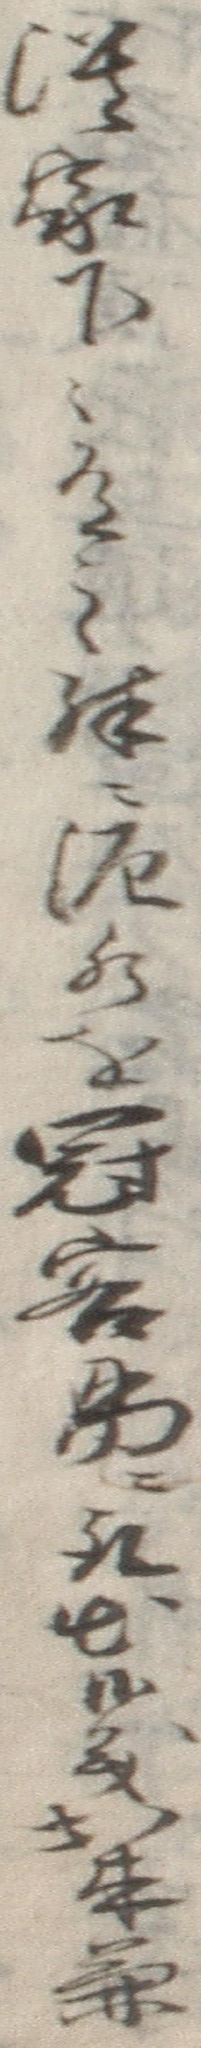潰家下々有之殊ニ泥水を冠容易ニ取出候義出来兼
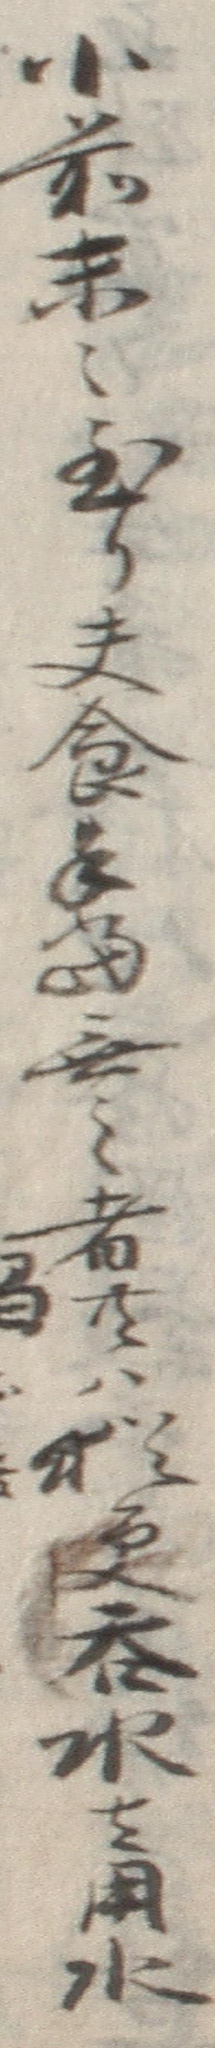小前末ゝ至り夫食手当無之者共ハ猶更呑水は用水
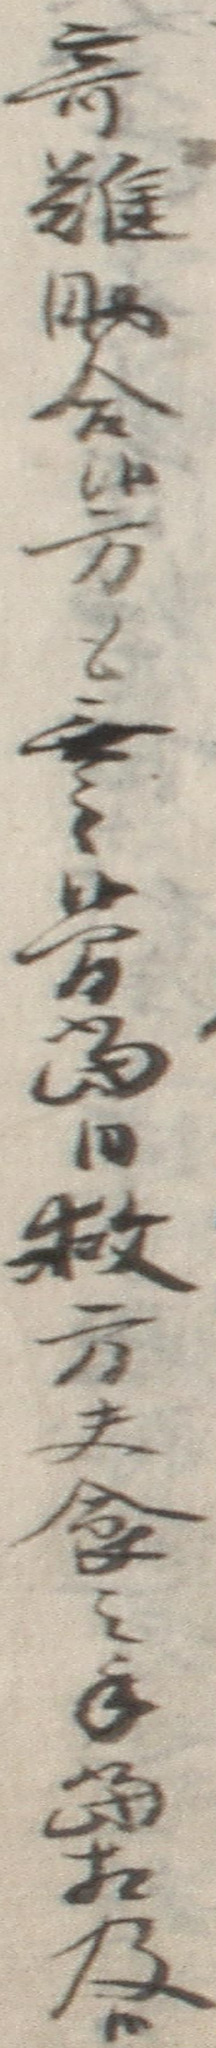寄難助合候方も無之候間当日救方夫食之手当相及候

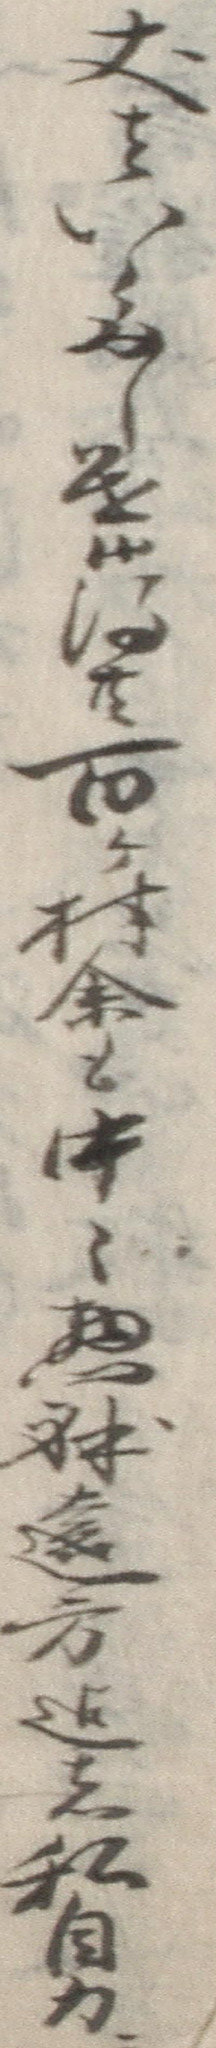丈はいたし遣候得共百ヶ村も中々惣躰遠方迠者私自力ニ
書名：[善光寺地震に関する冊子]
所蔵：東京大学地震研究所図書室 Earthquake Research Institute Library, The University of Tokyo, JAPAN
